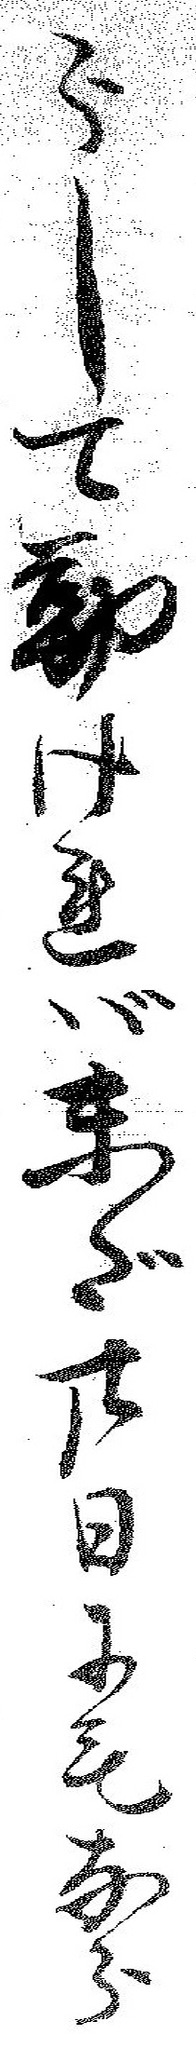らして勤ければ未だ二十日にもなら
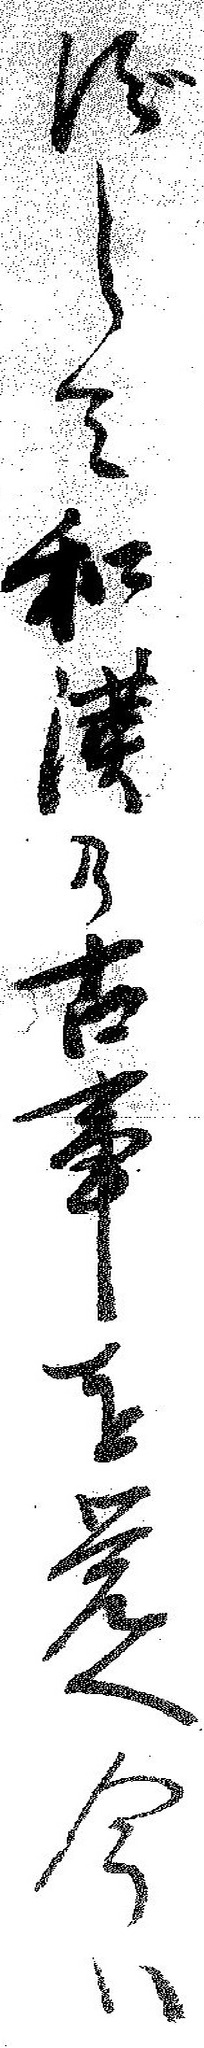ずして和漢の古事を覚へ今は
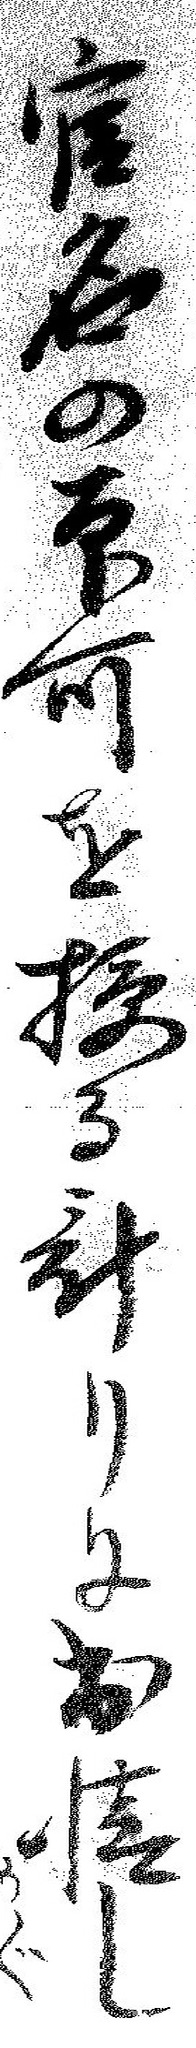官名の印可を授る計りに出精し
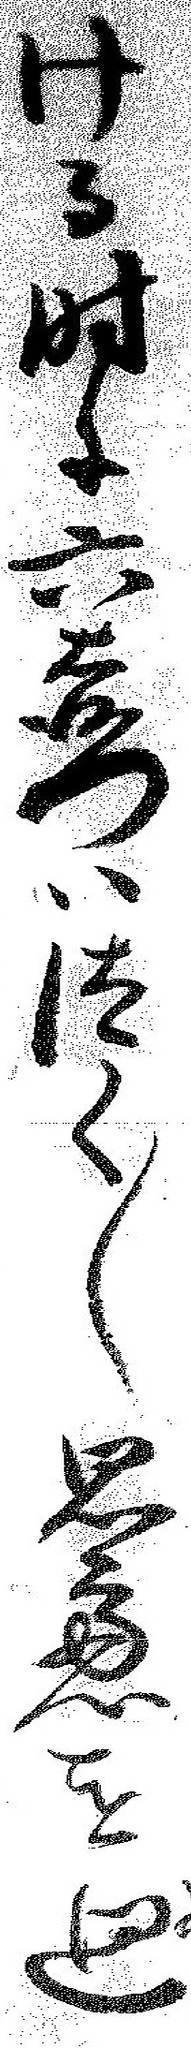ける時に六右衛門はつく〳〵思慮を廻
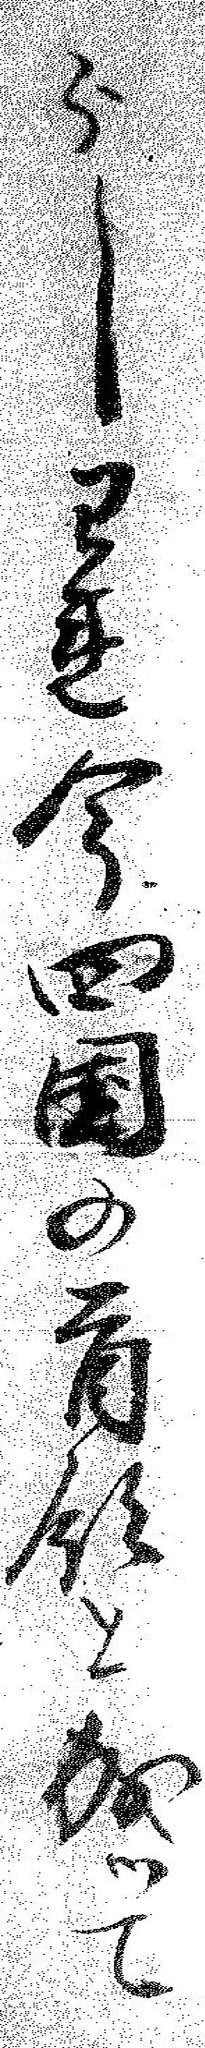らしわれ今四国の首領と成って

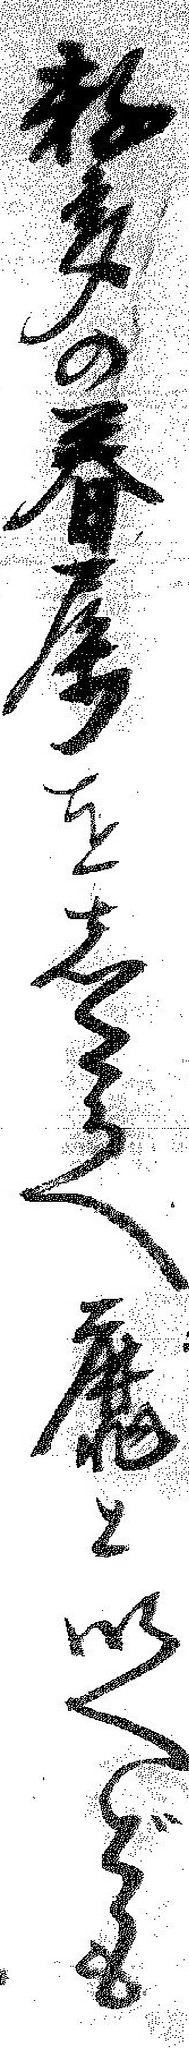数多の眷属をしたかへ靡といへども
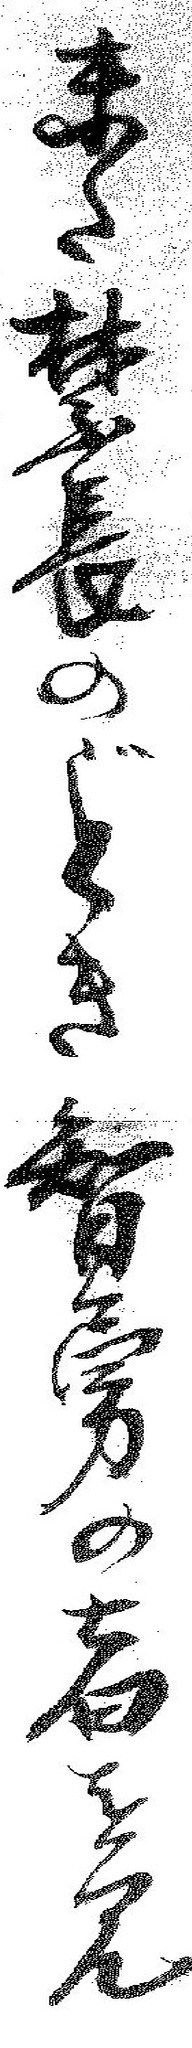未だ禁長のごとき智勇の者を見
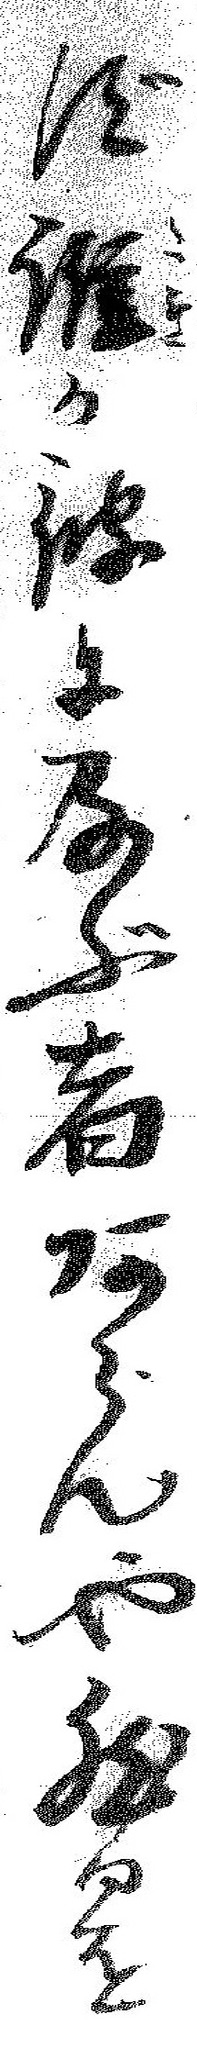ず誰か彼に及ぶ者あらんや然るを
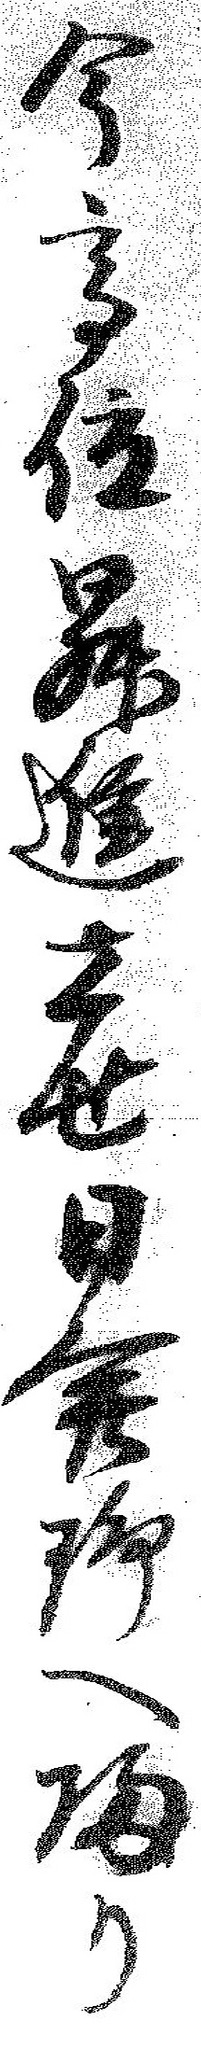今高位昇進させ日開野へ帰り
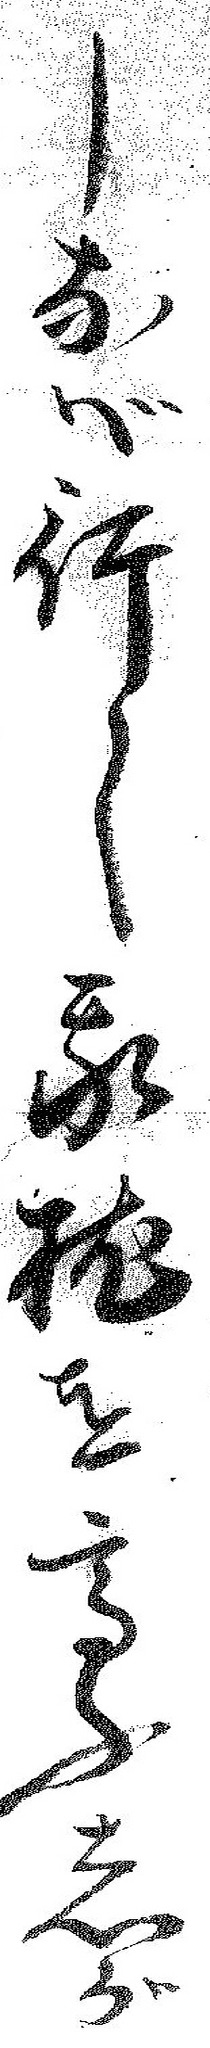しなば行〳〵我枕を高ふしが
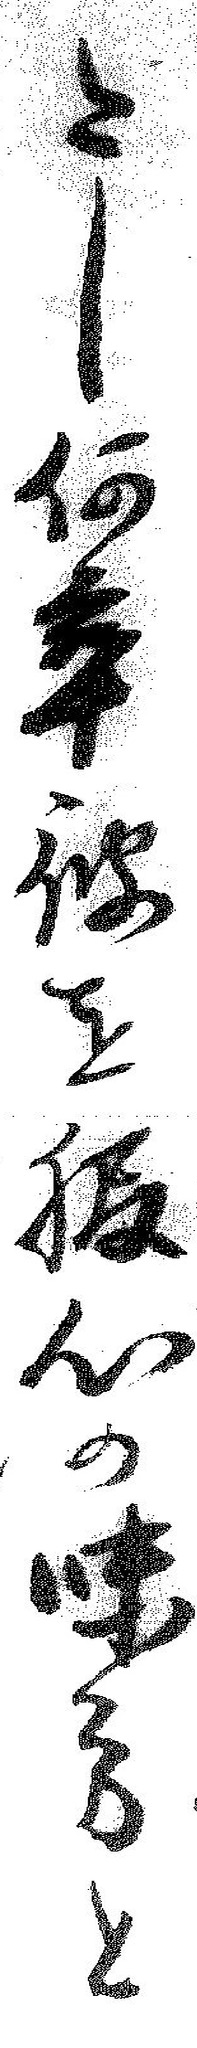たし何卒彼を腹心の味方と
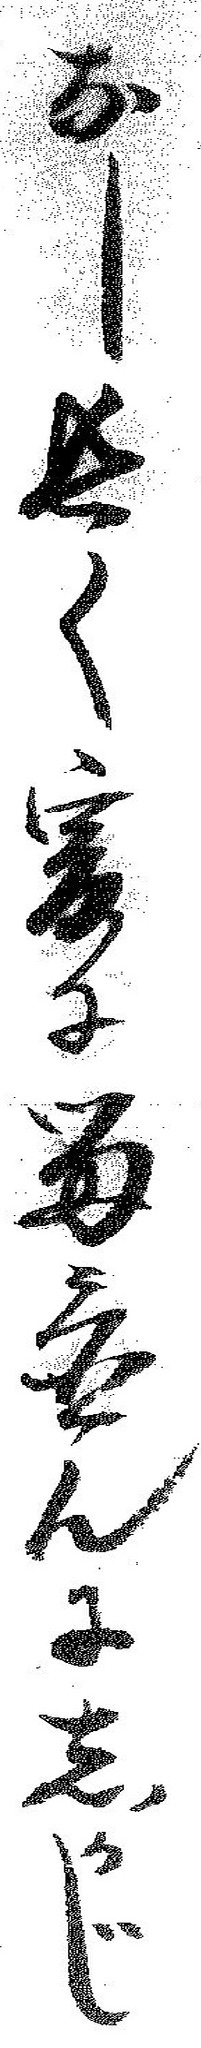なし長く爰に留置んにしかじ
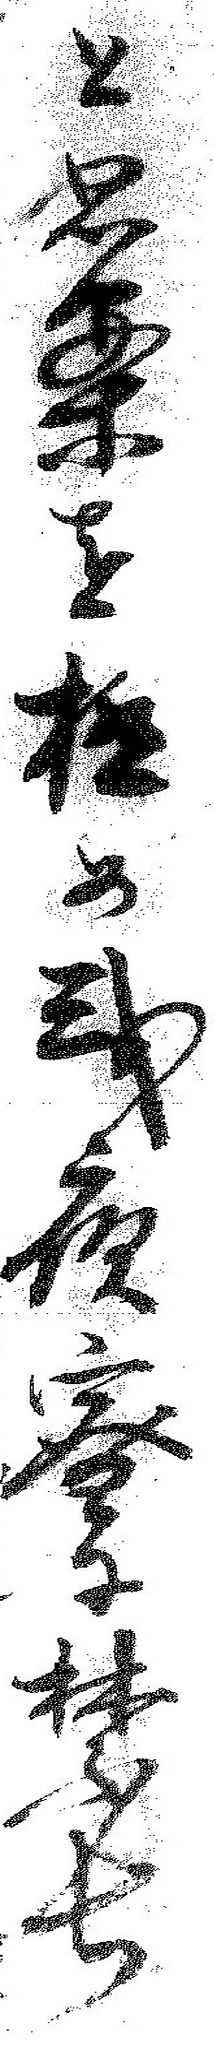と思案を極め或夜密に禁長
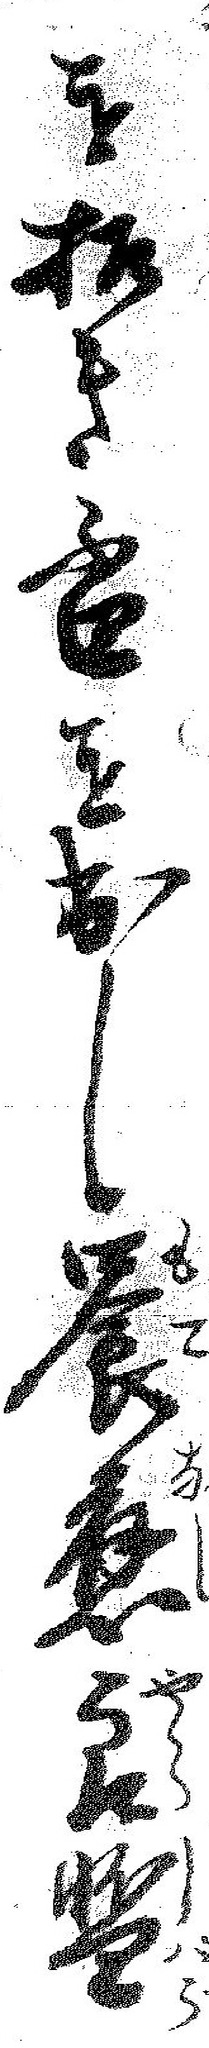を招き盃を出し饗応良暫
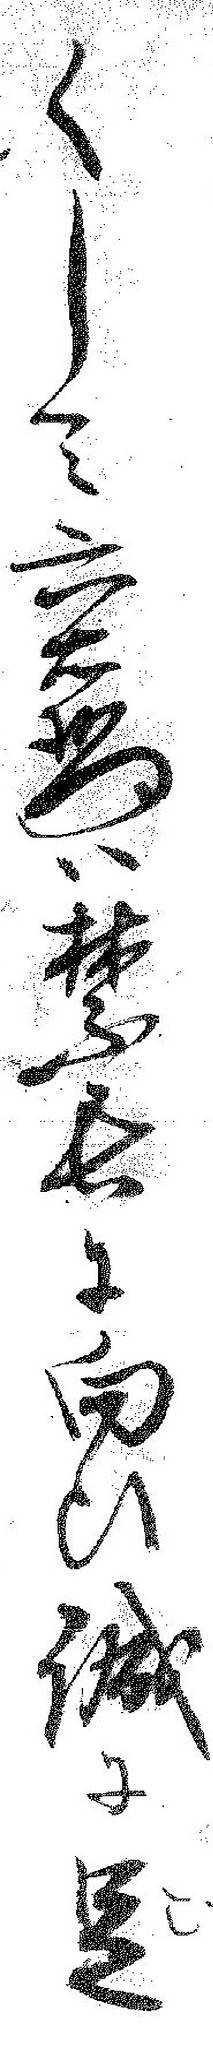くして六右衛門は禁長に向ひ誠に足
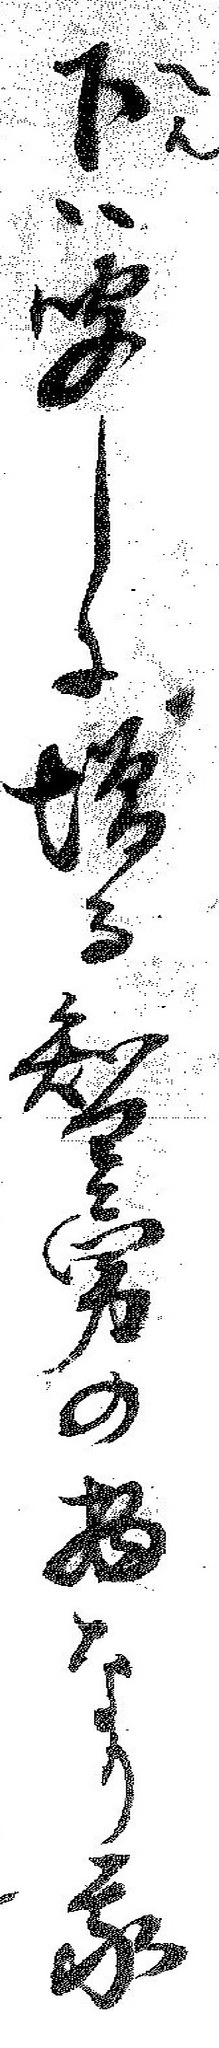下は聞しに増る智勇の物なり我
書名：近頃古狸珍説　礼義智信
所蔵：徳島県立図書館
